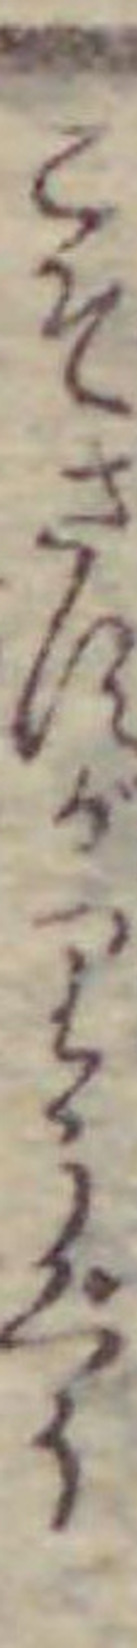こそさすがりうぐう
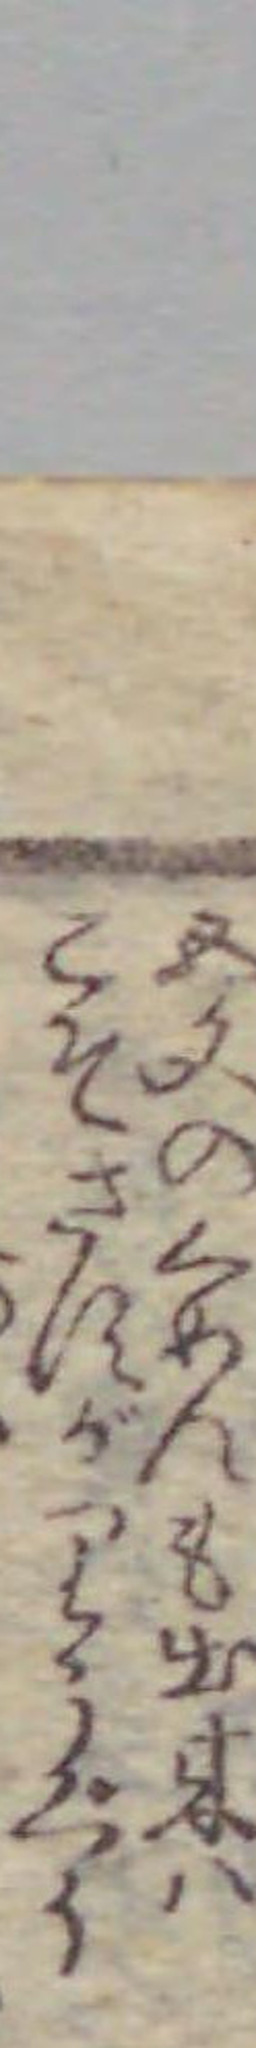こそさすがりうぐう
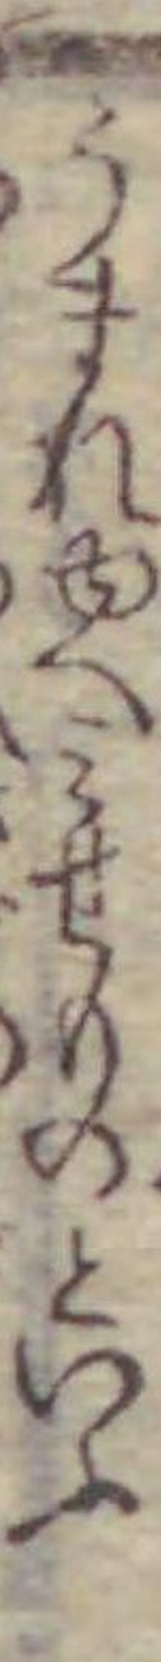うまれゆへみせものといふ
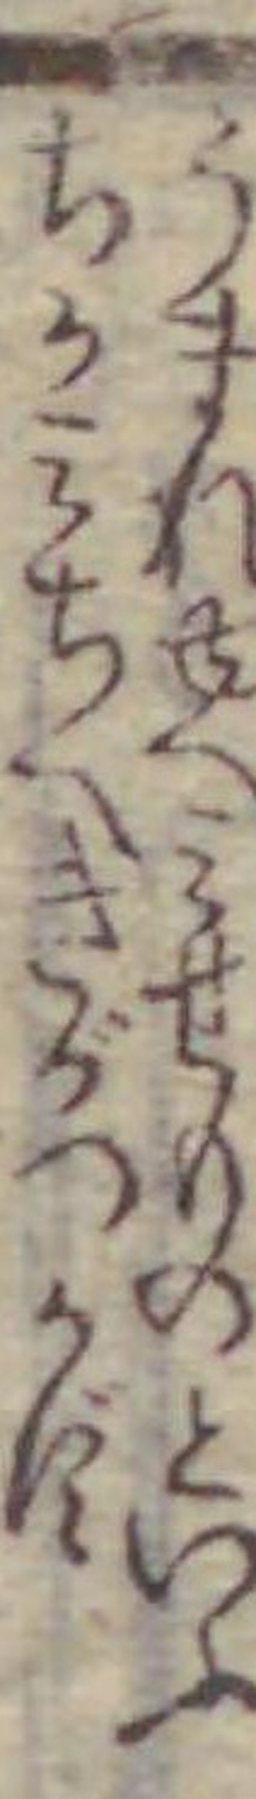ちかみちへきがつかず
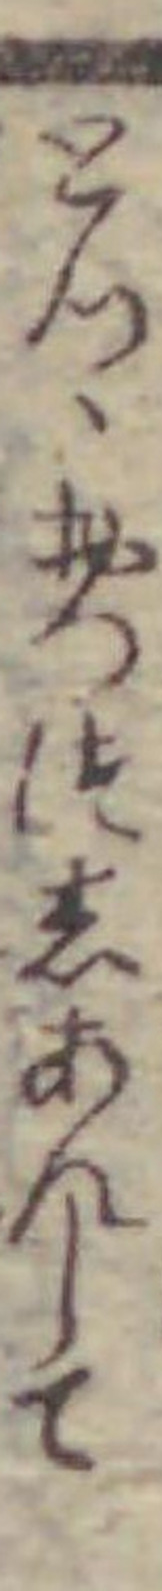とつゝおつつしあんして
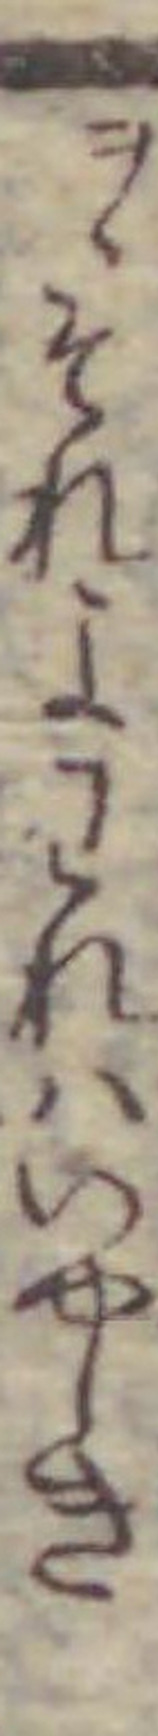ヲヽそれよわれはいやしき
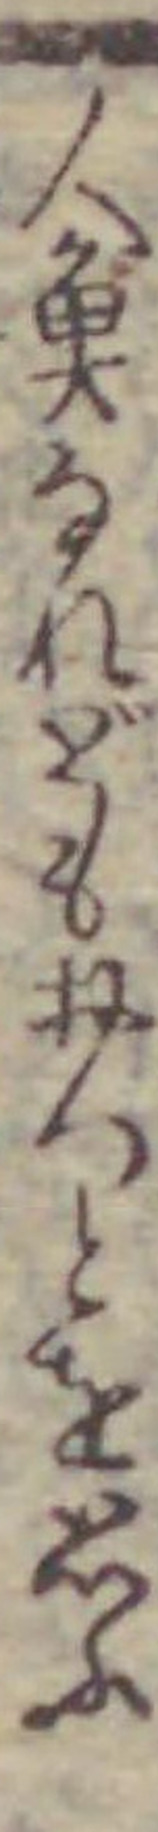人魚なれどもおつとを思ふ
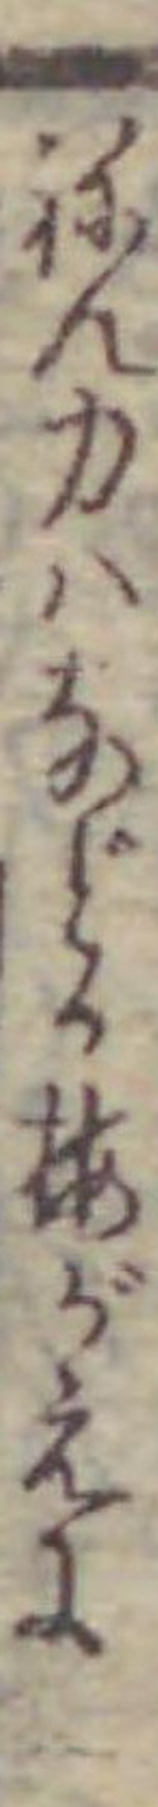ねん力はなどか梅がえに
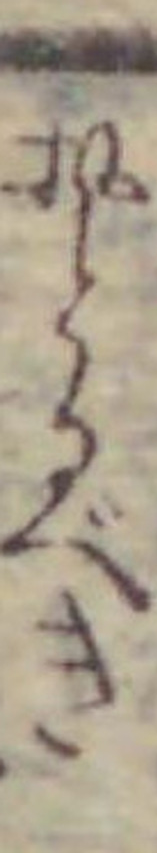おとるべき
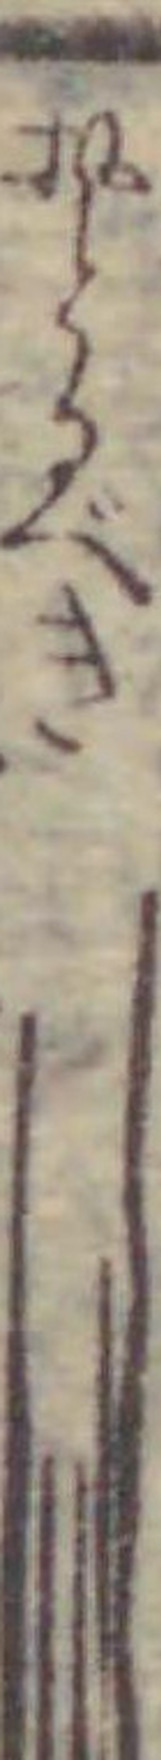おとるべき
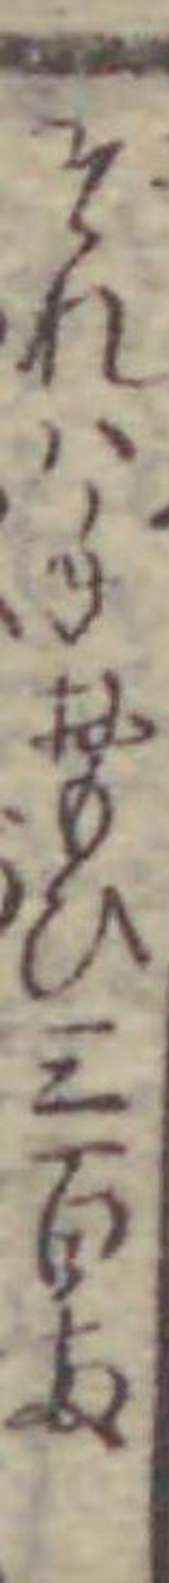それは手おもひ三百両
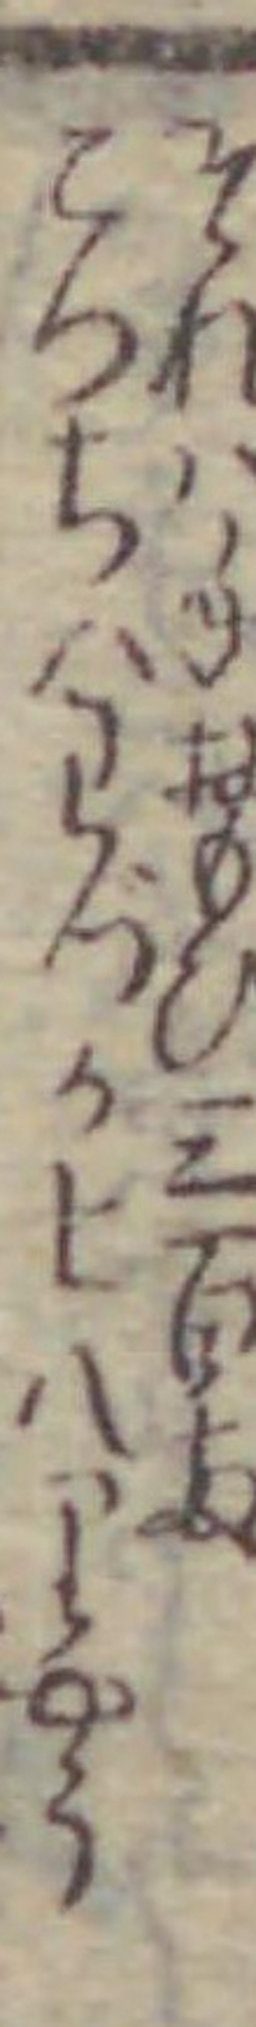こつちはわづか七八りやう
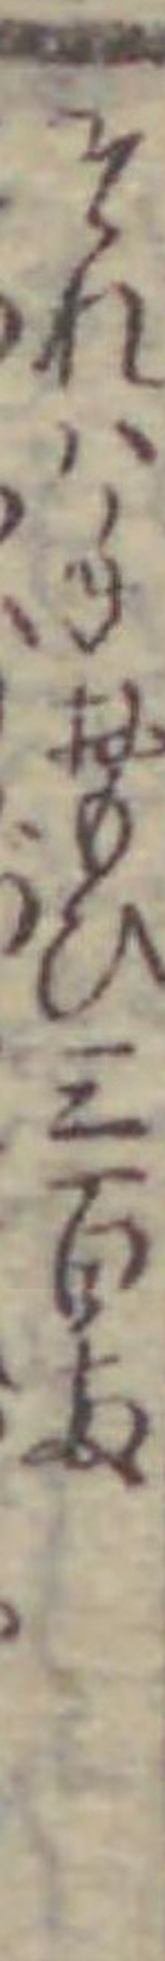それは手おもひ三百両
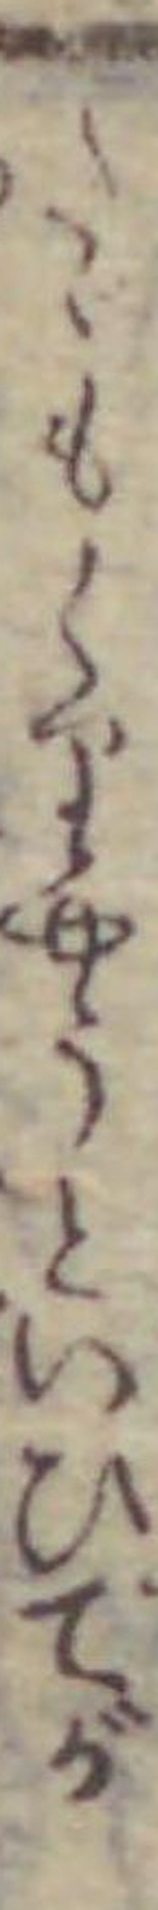たゞもくりやうといひてが
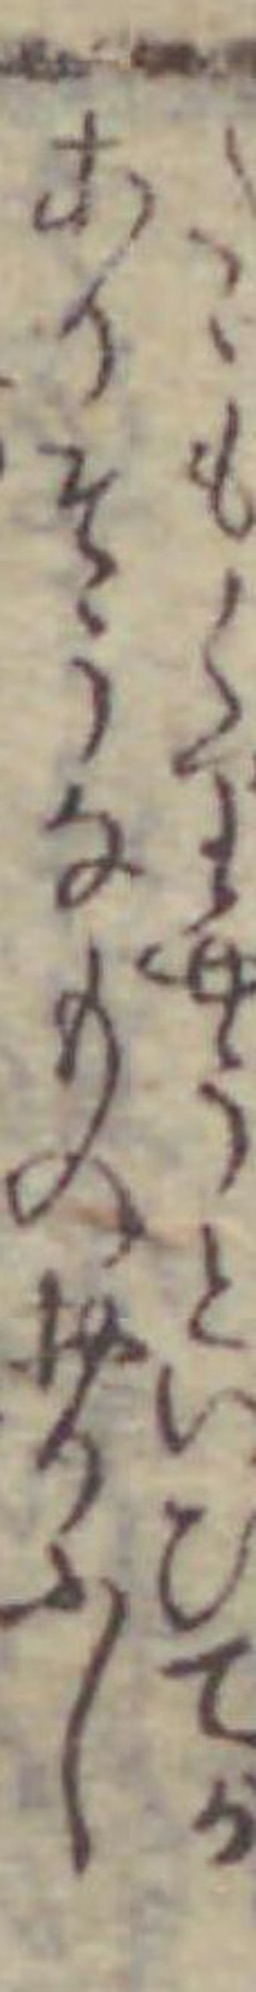ありそうなものおりふし
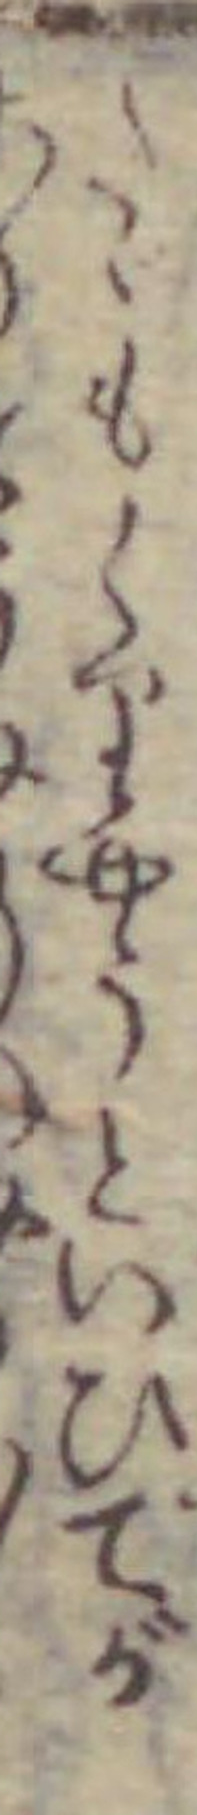たゞもくりやうといひてが
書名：箱入娘面屋人魚 3巻
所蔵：国立国会図書館 National Diet Library, JAPAN
